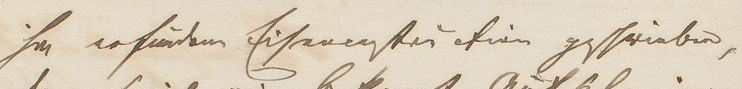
ihm erfundene Eisenconstruction geschrieben,
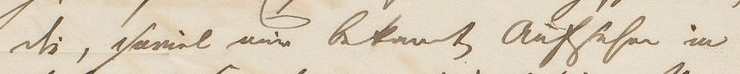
die, soviel mir bekannt, Aufsehen in
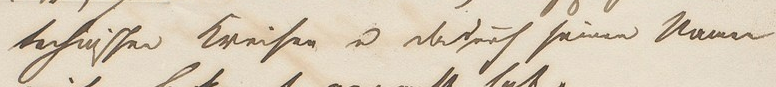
technischen Kreisen & dadurch seinen Namen
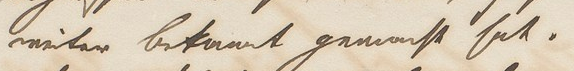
weiter bekannt gemacht hat.
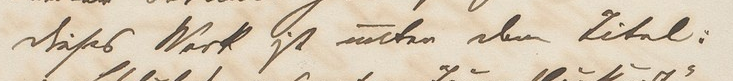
Dieses Werk ist unter dem Titel:
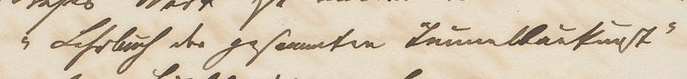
«Lehrbuch der gesammten Tunnelbaukunst»
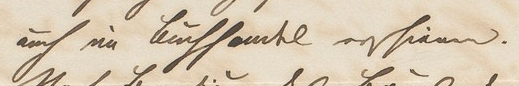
auch im Buchhandel erschienen.
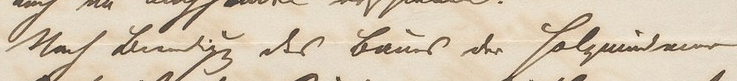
Nach Beendigung des Baus der Holzmindener
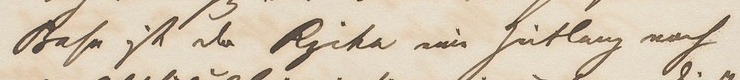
Bahn ist der Rziha eine Zeitlang noch
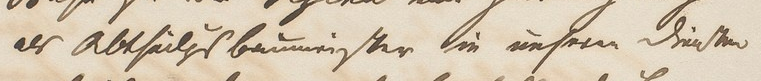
als Abteilungsbaumeister in unseren Diensten
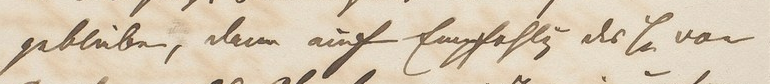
geblieben, dann auf Empfehlung des Hn von
